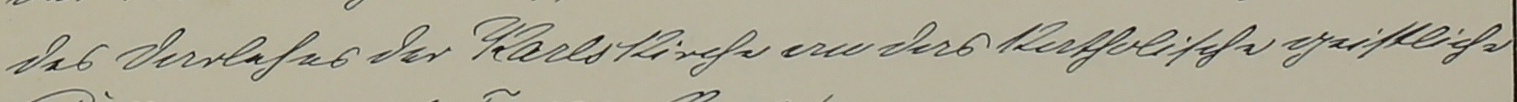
des Darlehns der Karlskirche an das katholische geistliche
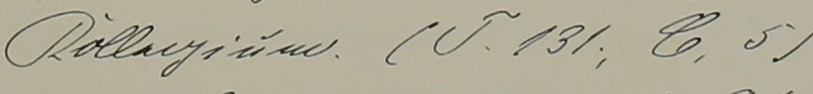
Kollegium. (T.131; C.5).
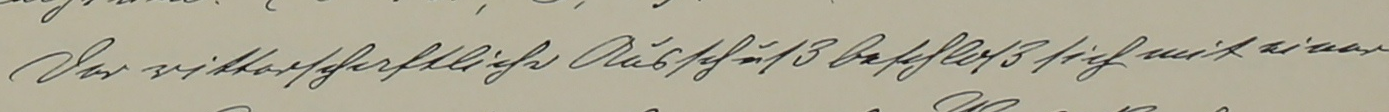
Der ritterschaftliche Ausschuß beschloß sich mit einer
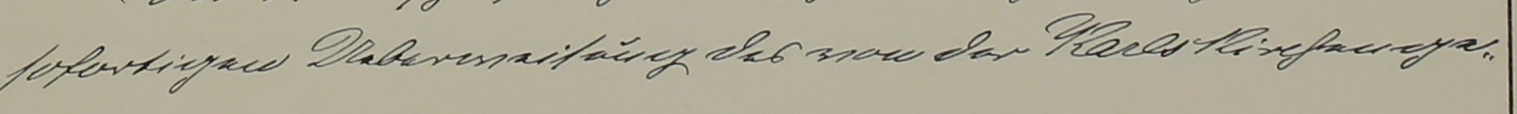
sofortigen Ueberweisung des von der Karlskirchenge-
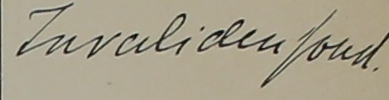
Invalidenfond
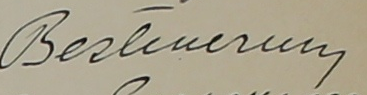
Besteuerung
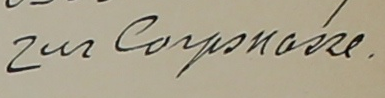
zur Corpskasse
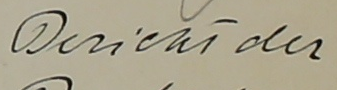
Bericht der
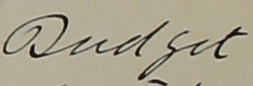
Budget
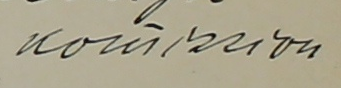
kommission
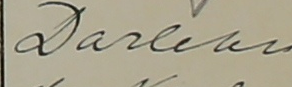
Darlehn
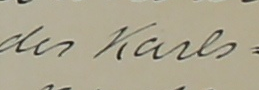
der Karls
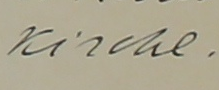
kirche
